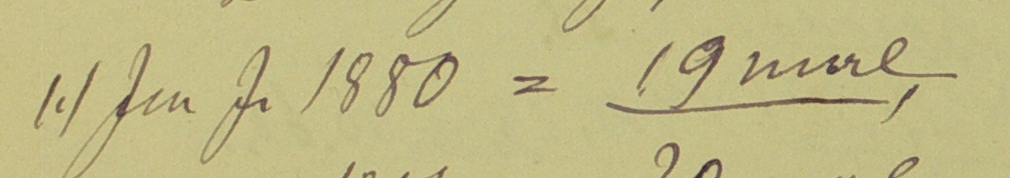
1.) Im Jahre 1880 = 19 mal.-
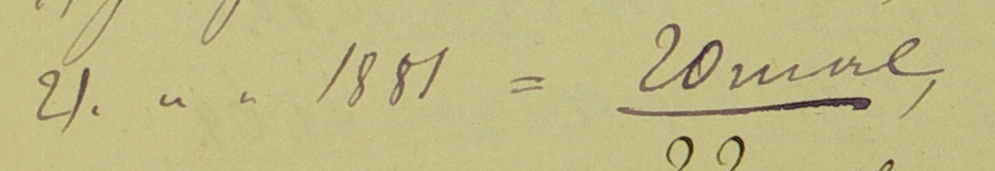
2.) * 1881 = 20 mal
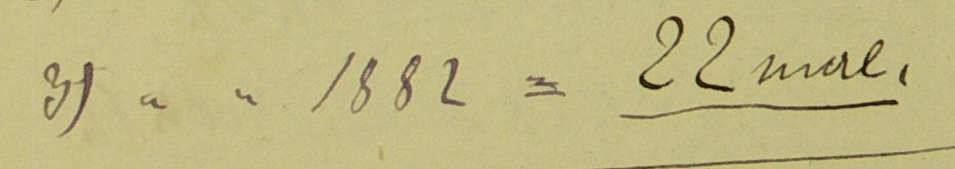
3.) * 1882 = 22 mal.-
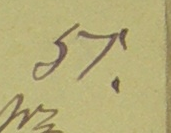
51
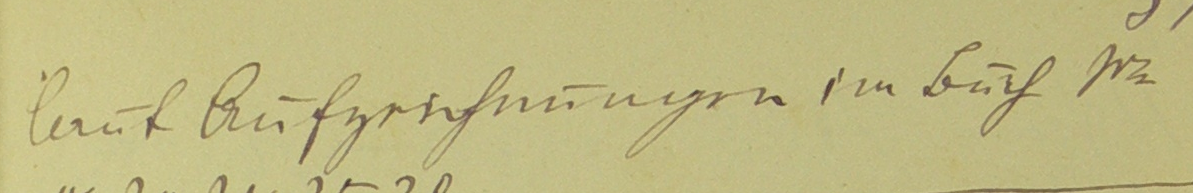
Laut Aufzeichnungen im Buch Nr:
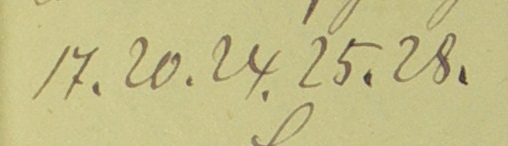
17.20.24.25.28
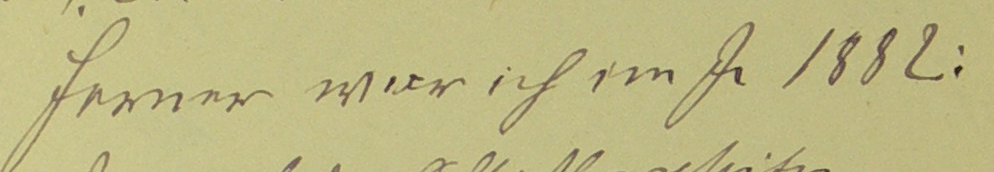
Ferner war ich im J. 1882:
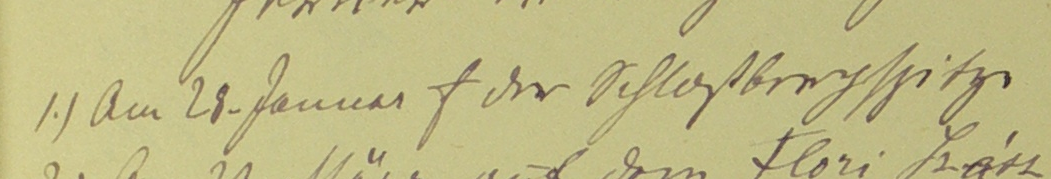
1.) Am 28. Januar auf der Schloßbergspitze
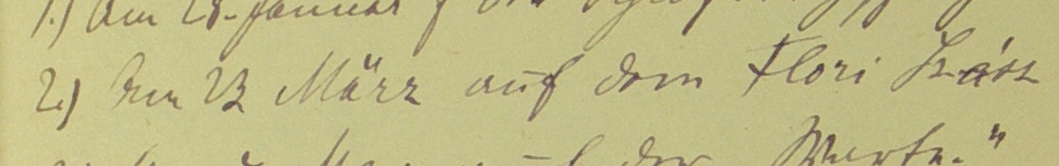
2.) * 23. März auf dem Flori Szasz
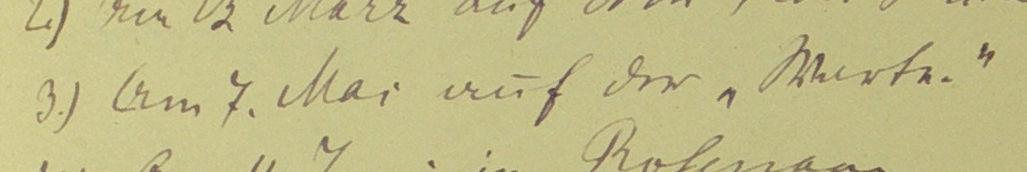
3.) * 7. Mai auf der „Warte“
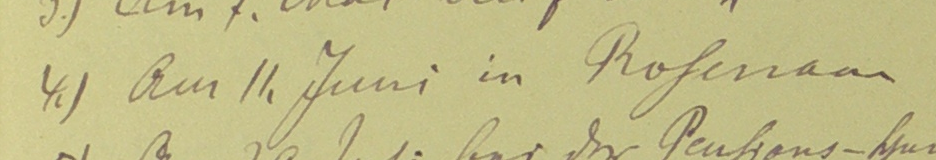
4.) * 11. Juni in Rosenau
